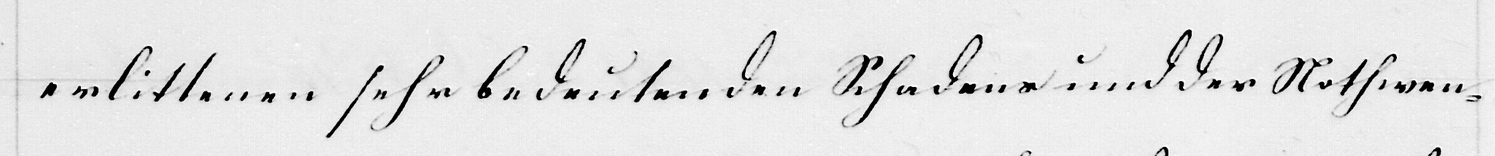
erlittenen sehr bedeutenden Schadens und der Nothwen¬
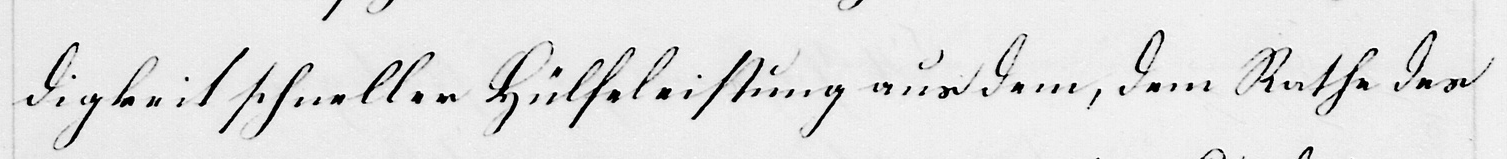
digkeit schneller Hülfeleistung aus dem, dem Rathe des
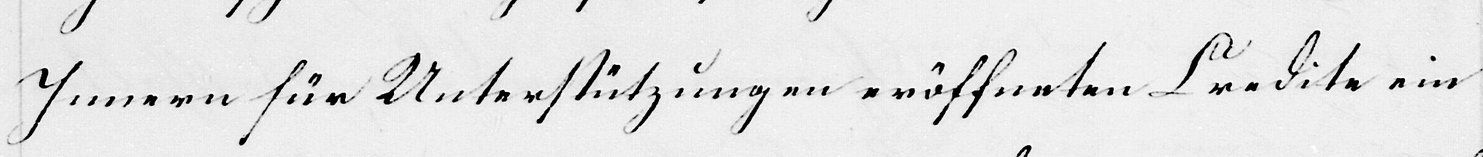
Innern für Unterstützungen eröffneten Credite ein
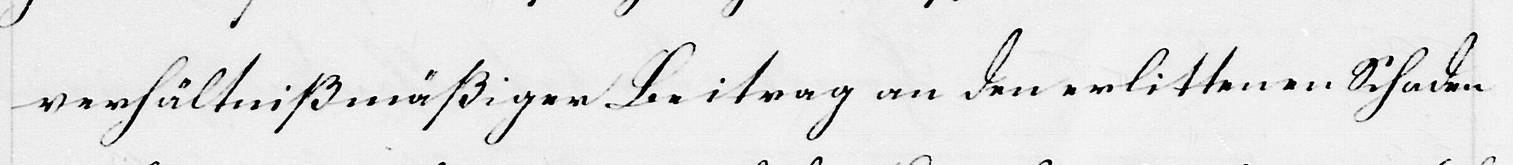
verhältnißmäßiger Beitrag an den erlittenen Schaden
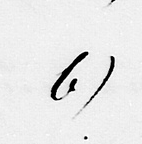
b)
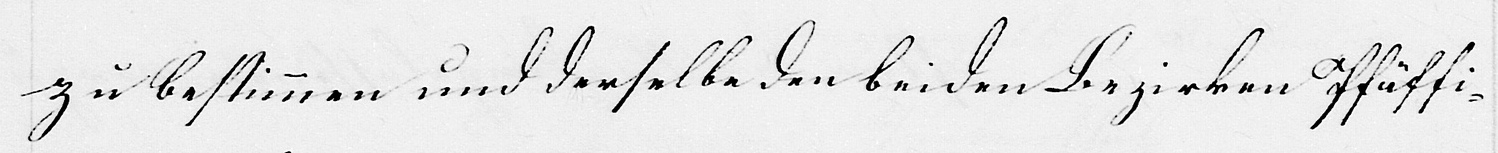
zu bestimmen und derselbe den beiden Bezirken Pfäffi¬
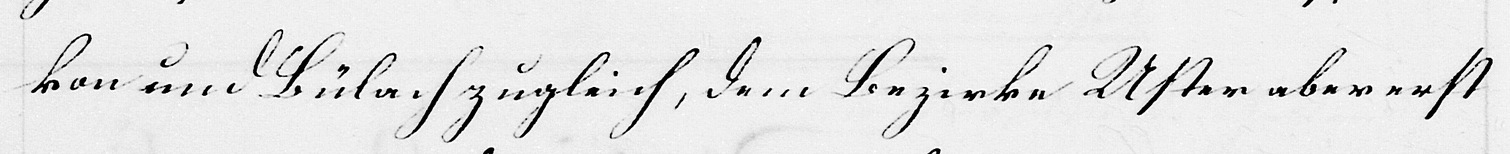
kon und Bülach zugleich, dem Bezirke Uster aber erst
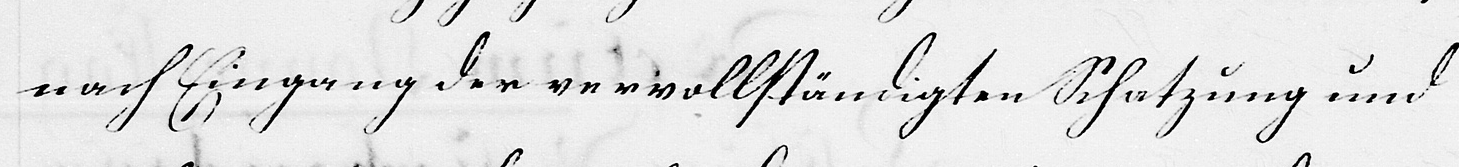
nach Eingang der vervollständigten Schatzung und
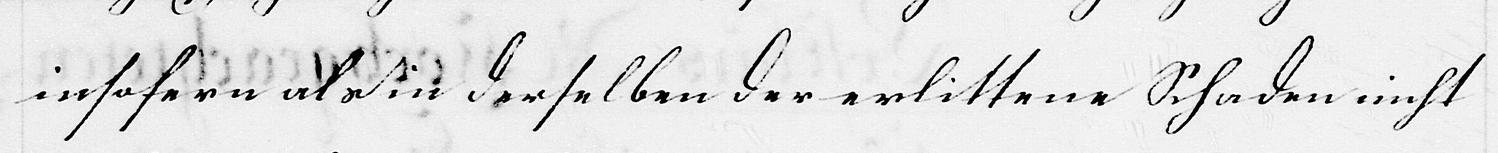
insofern also in derselben der erlittene Schaden nicht
